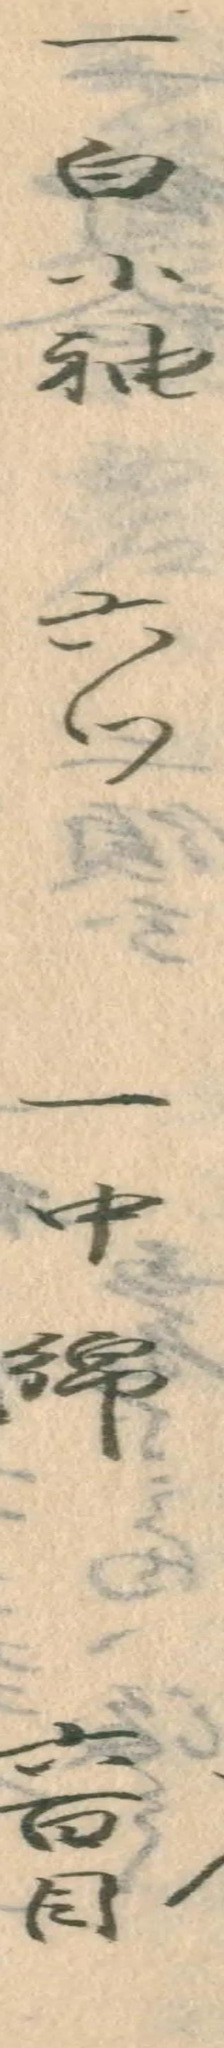一白小袖六ツ一中綿六百目
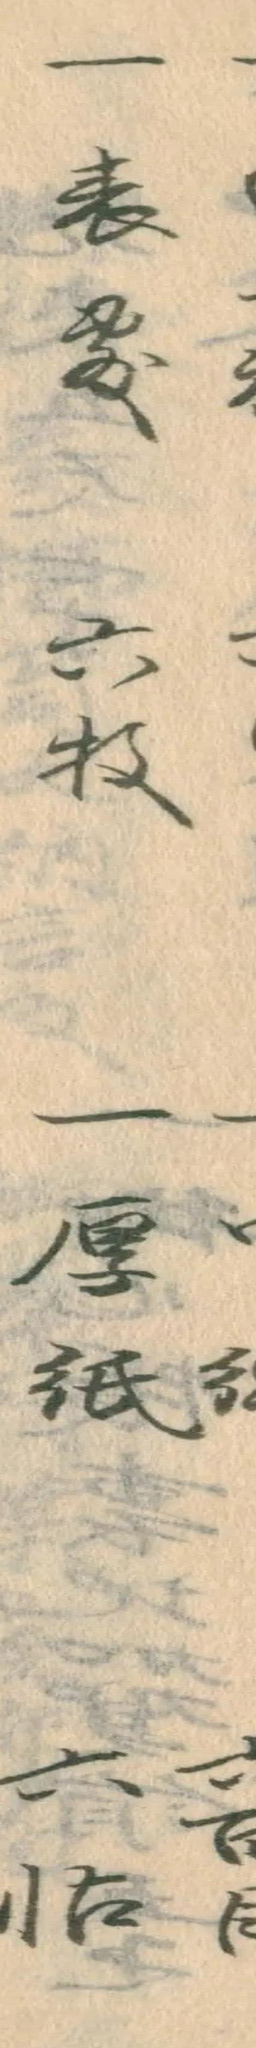一表敷六枚一厚紙六帖
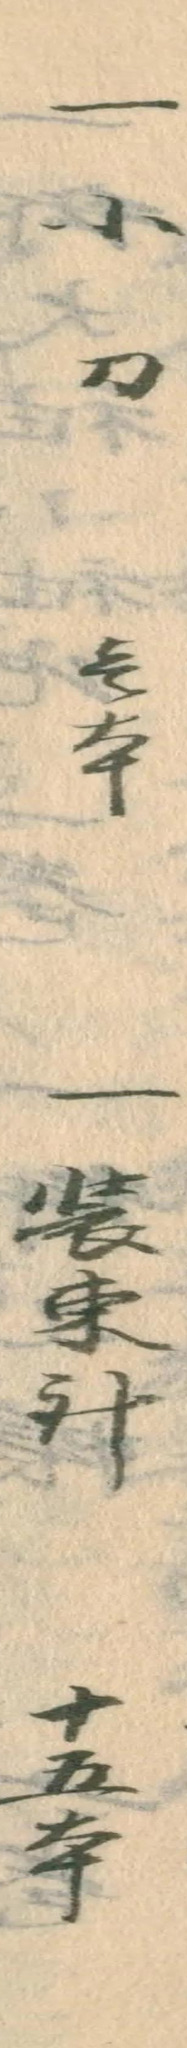一小刀壱本一装束針十五本
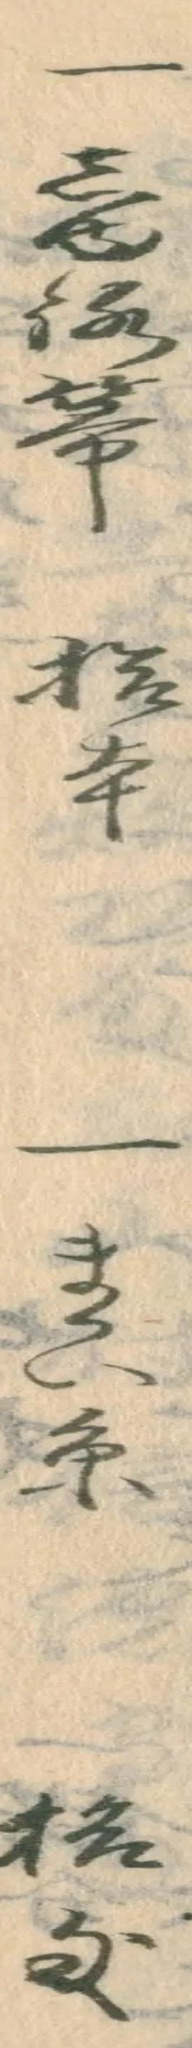一しゆ路箒拾本一まかい糸拾匁
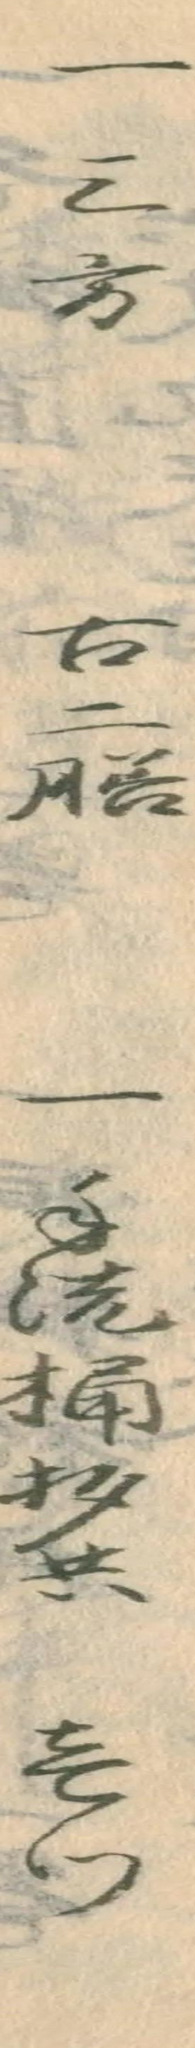一三方古二膳一手洗桶杓共壱ツ
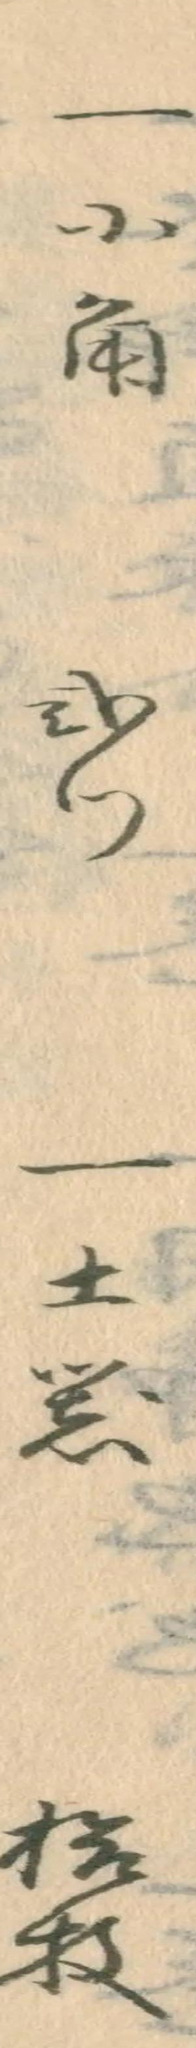一小角弐ツ一土器拾枚

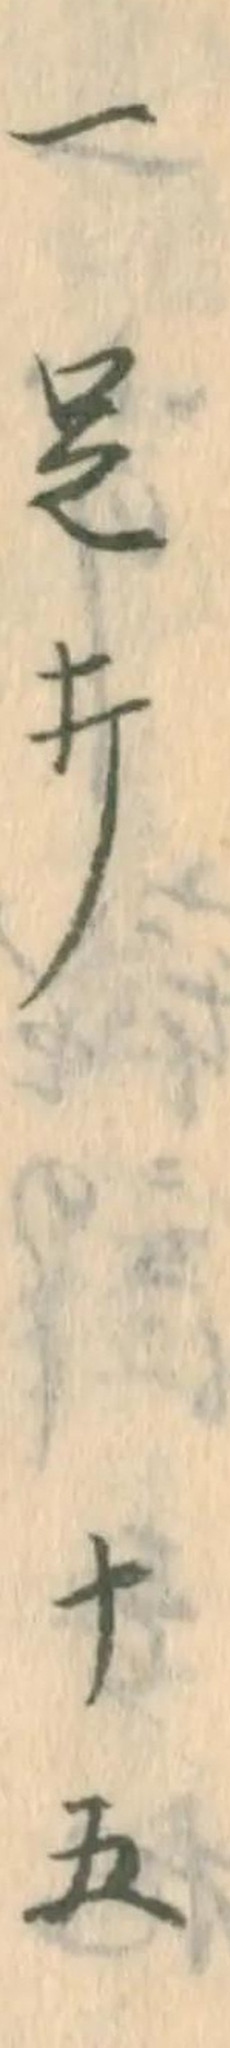一さら十五
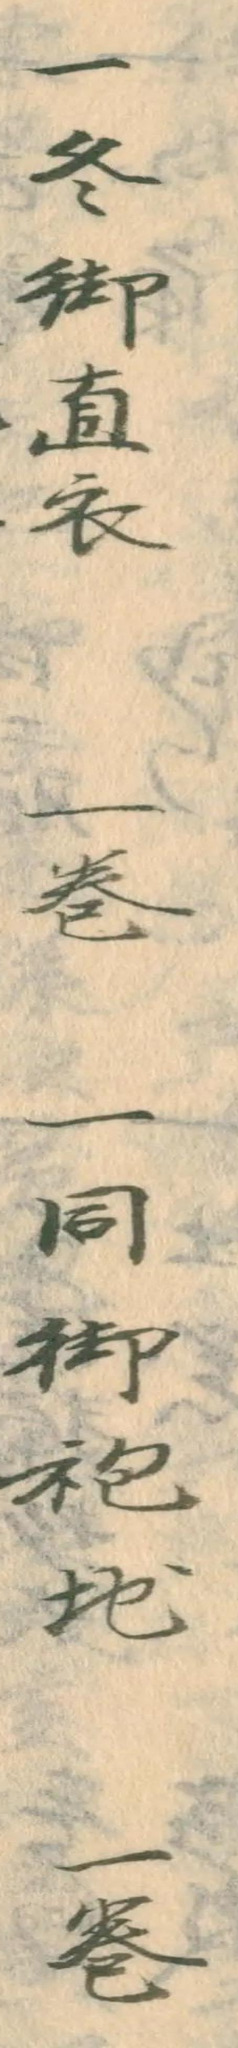一冬御直衣一巻一同御袍地一巻
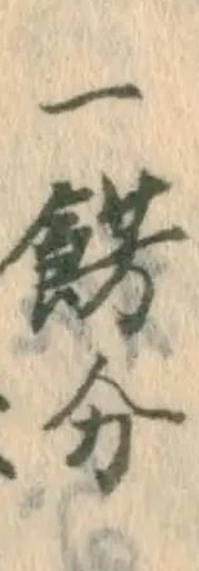一錺分
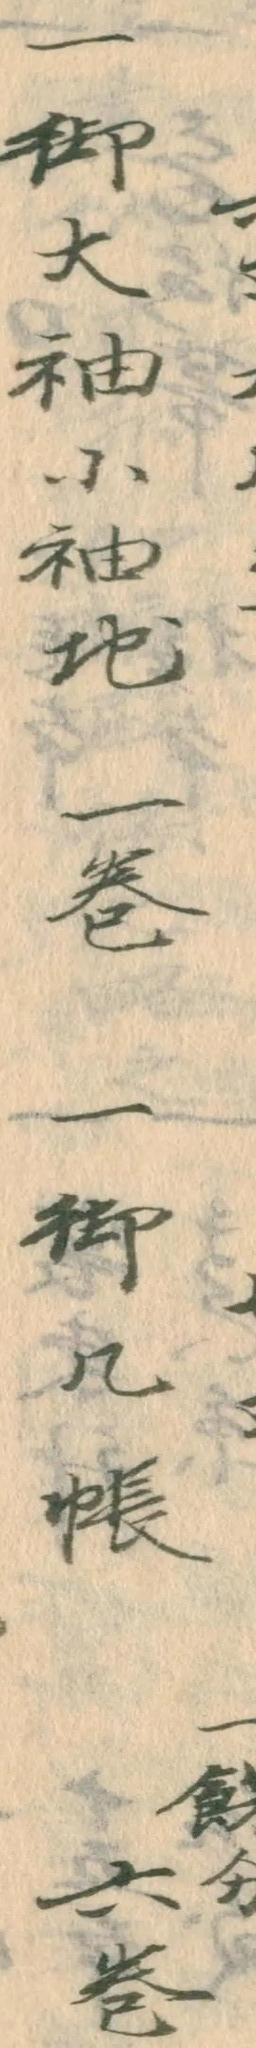一御大袖小袖地一巻一御几帳六巻
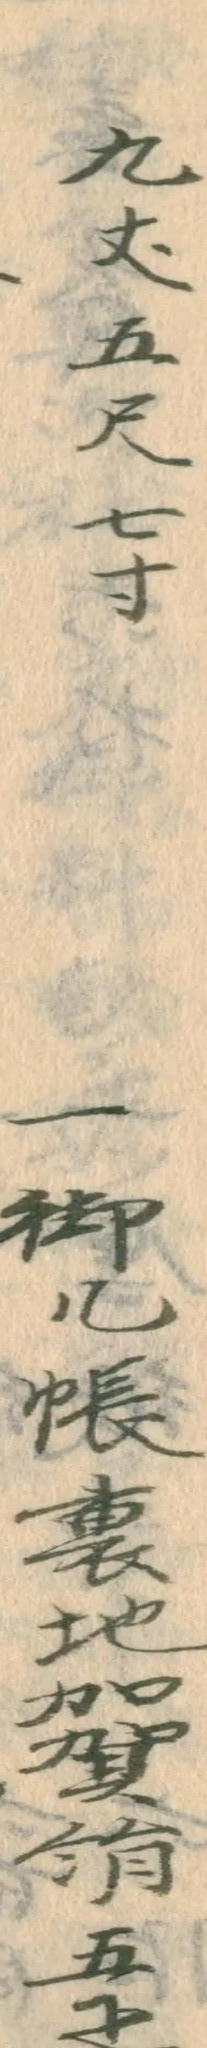一御袷二領分一御几帳裏地加賀絹五疋
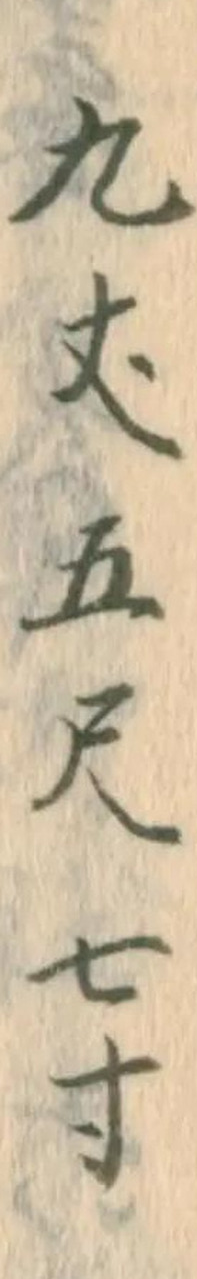九丈五尺七寸
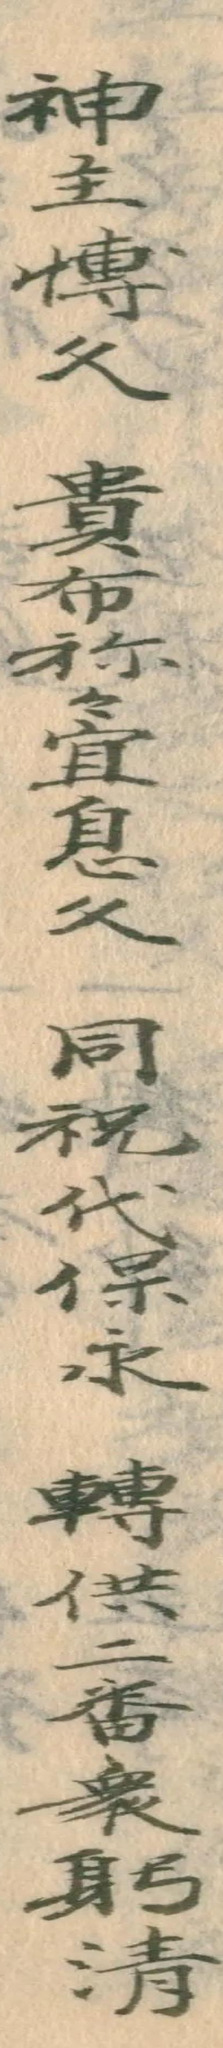神主博久貴布祢々宜息久同祝代保永転供二番衆躬清
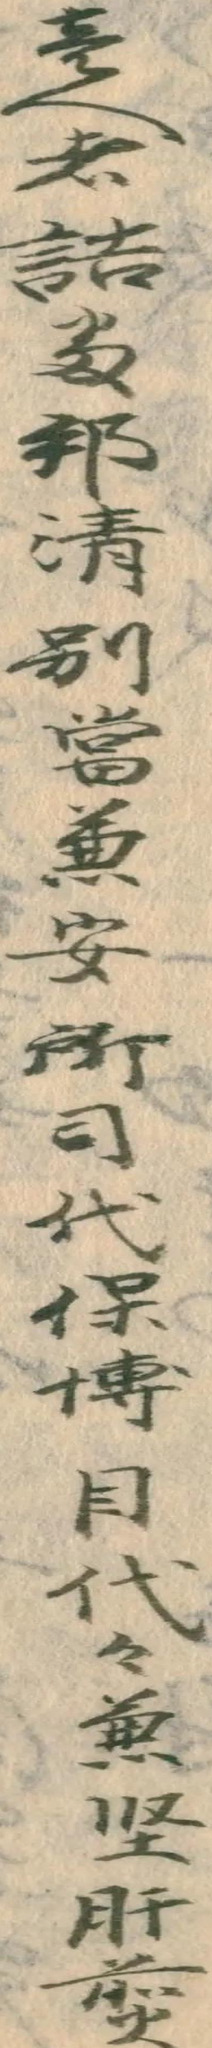壱人者詰番邦清別当兼安所司代保博目代々兼堅肝煎
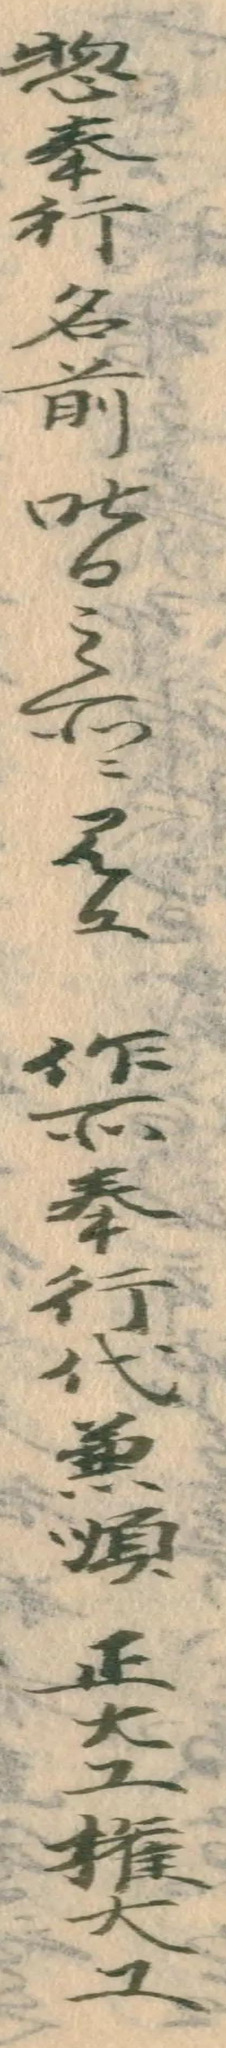惣奉行名前昨日之所ニ見ユ作所奉行代兼順正大工権大工
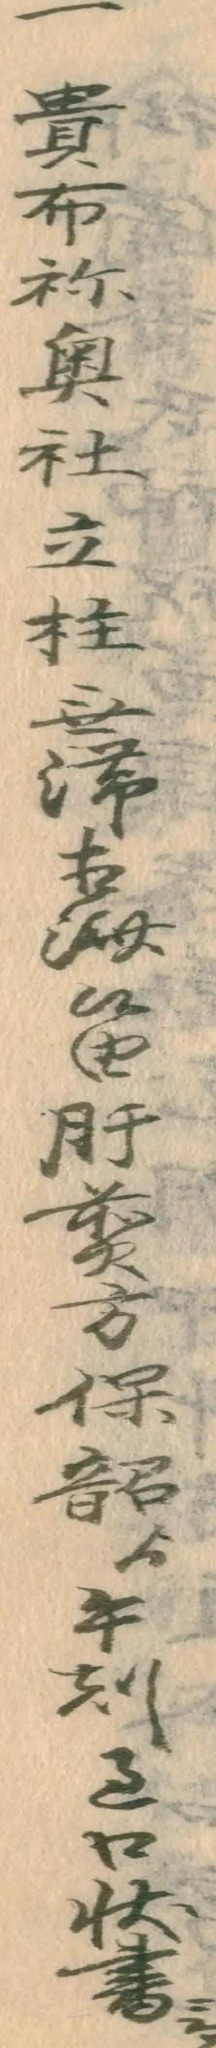一貴布祢奥社立柱無滞相済候由肝煎方保韶ゟ午刻過口状書ニ而
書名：賀茂社記録. 第17冊
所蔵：国立国会図書館 National Diet Library, JAPAN
